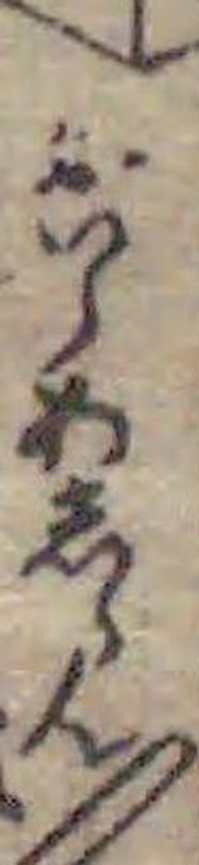おいらあしらんよ
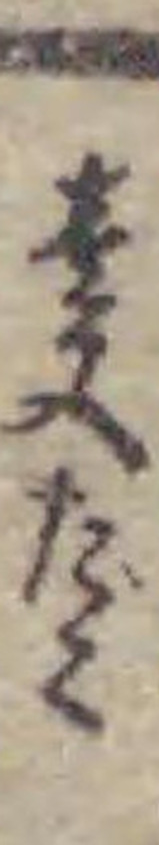壱文たこ
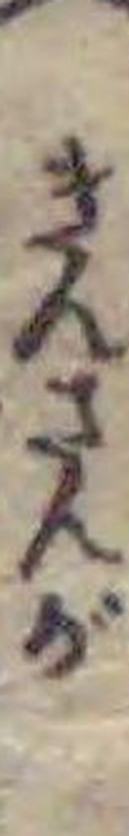きんさんが
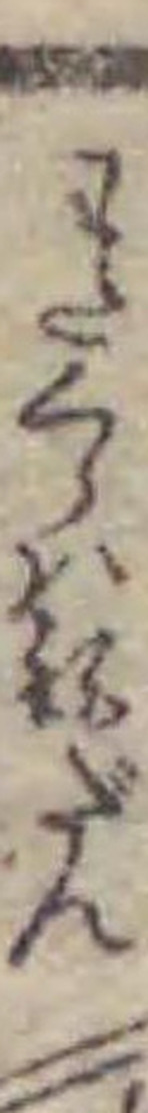わたくしはねだん
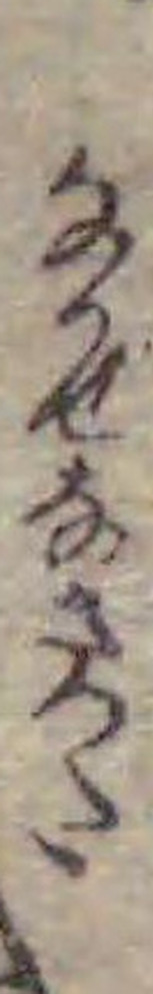なかせなさつた
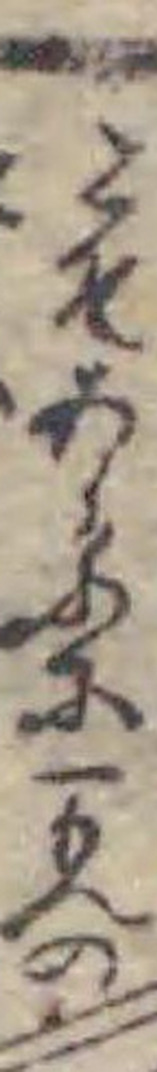こそあらふに一もんの
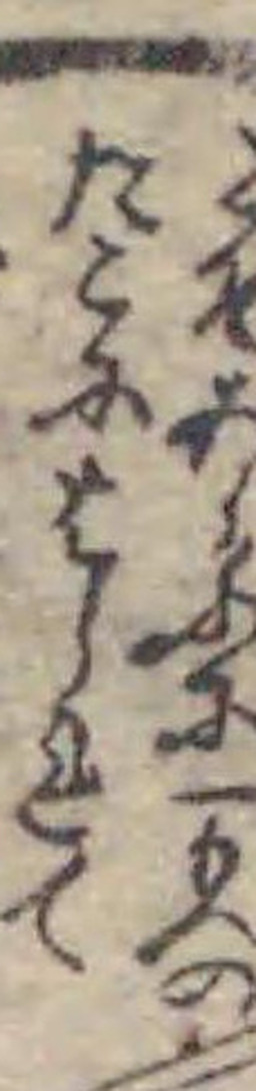たこにはられて
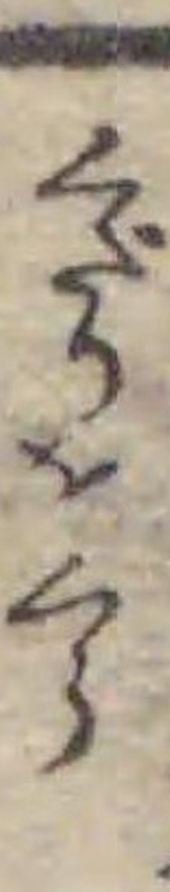くだりをくう
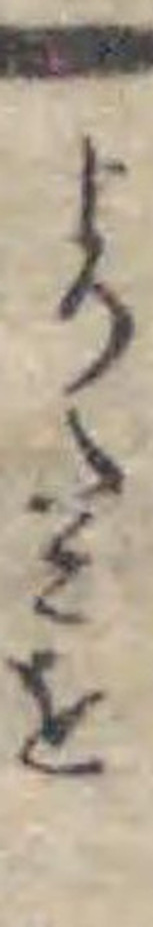よりたこを
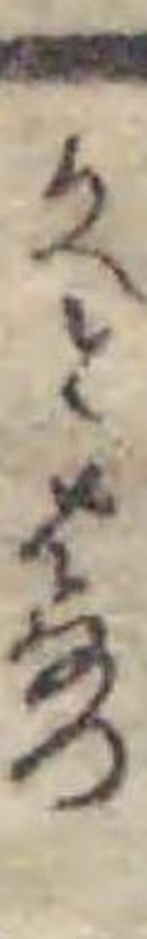かへとはなつ
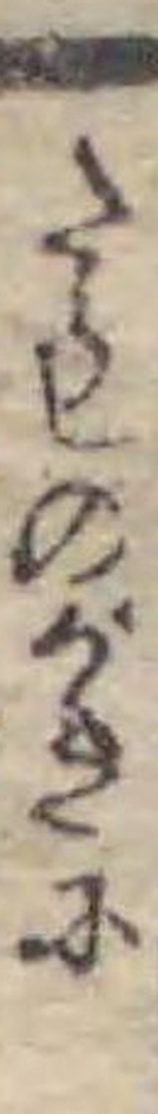たらしのがきに
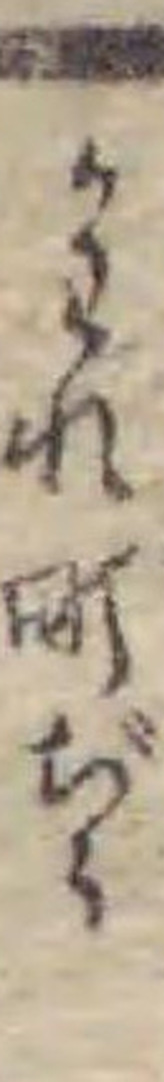かわれ町ぢう
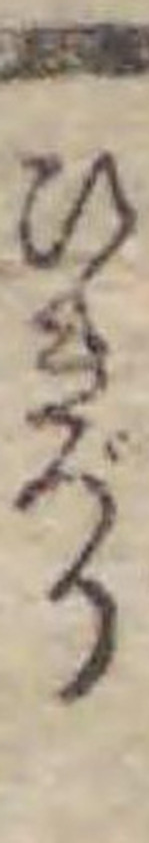ひきづり
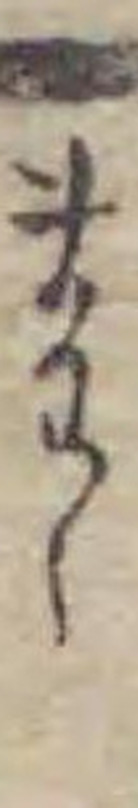まわし
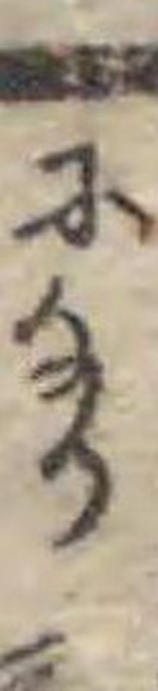になり
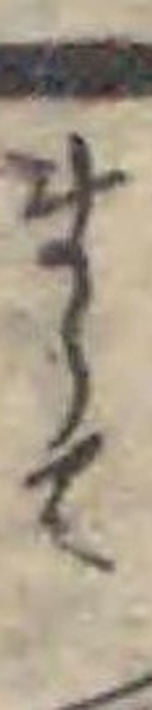まして
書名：紙屑身上噺 : 3巻
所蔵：国立国会図書館 National Diet Library, JAPAN
